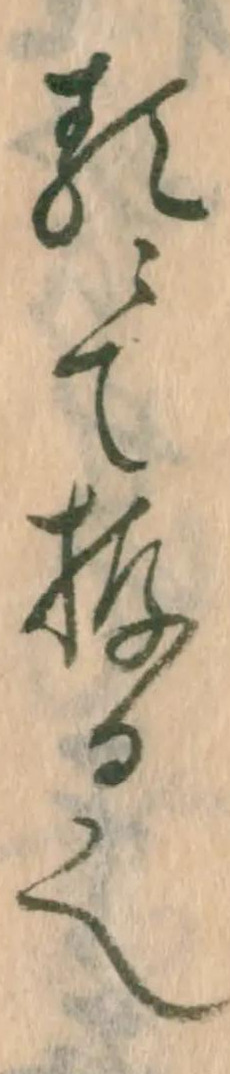類にて拵る也
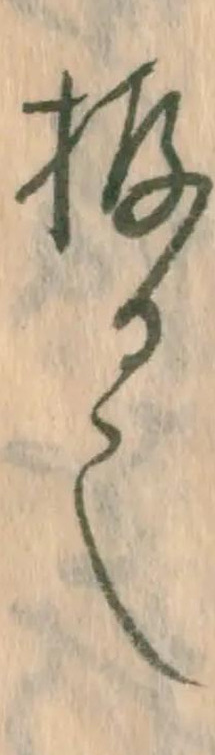拵る也
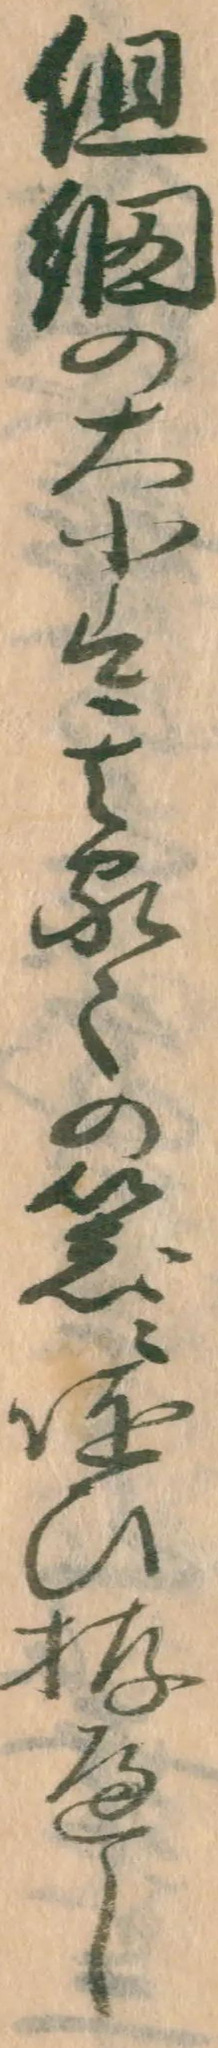但網の大小は其家々の器に従ひ拵へし
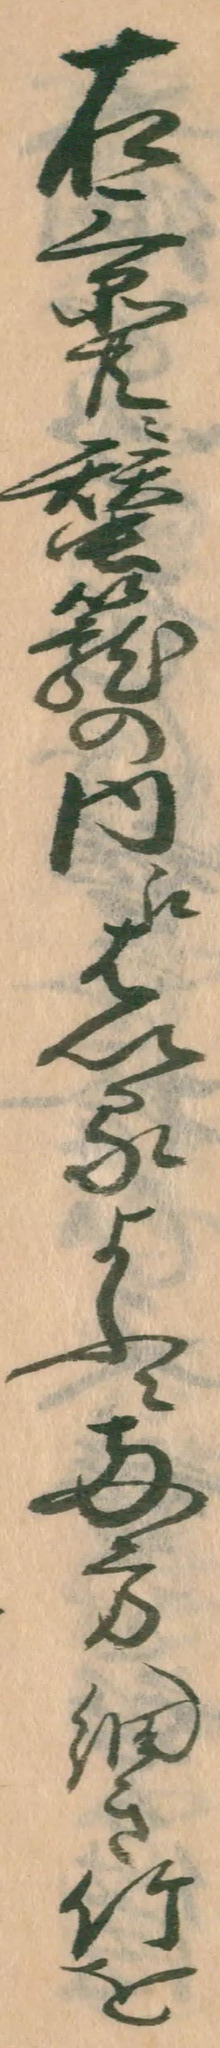右三品共に蚕籠の内えはいるよふに両方細き竹を
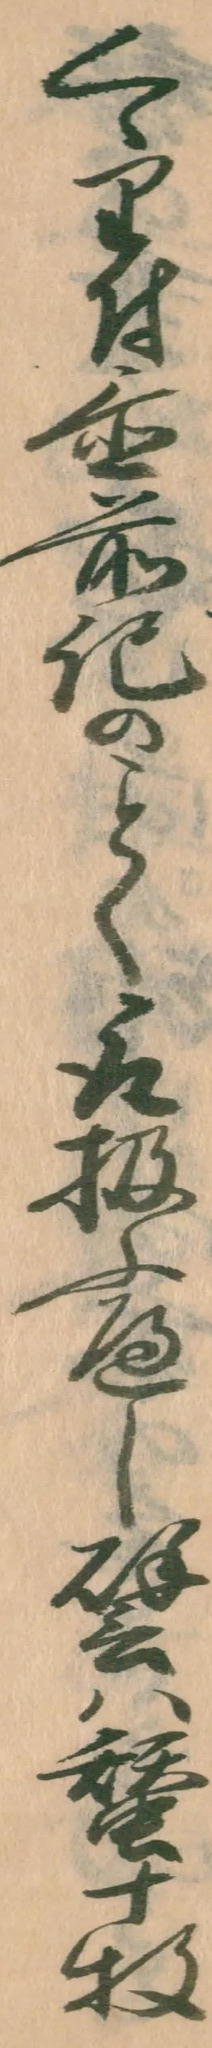くゝり付置前記のことく取扱ふへし譬は蚕十枚
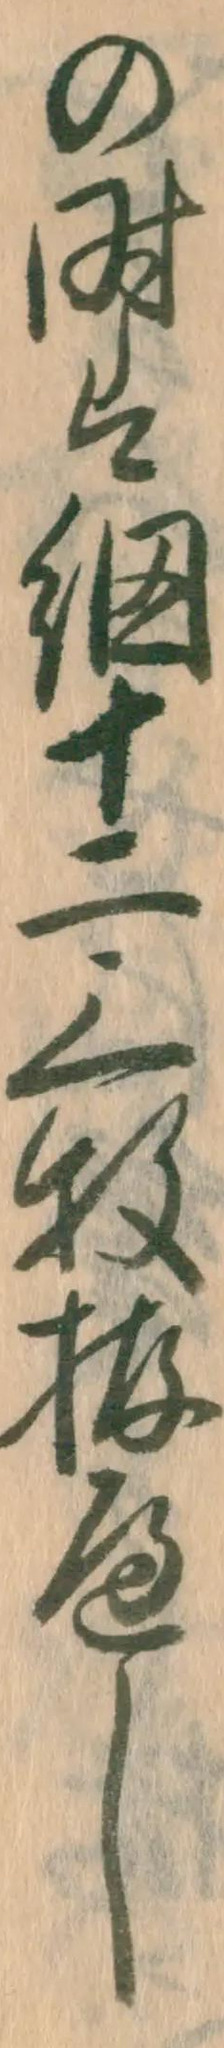の時は網十二三枚拵へし
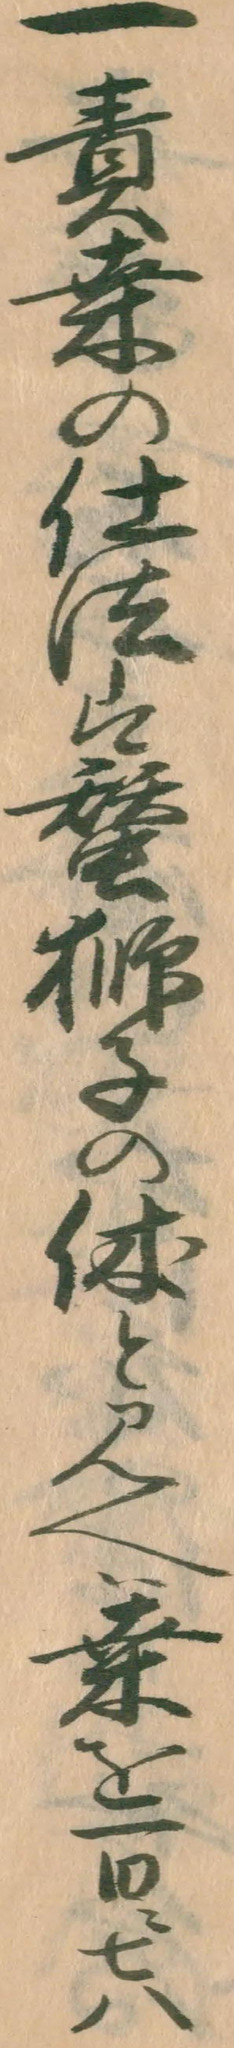一責桑の仕法は蚕獅子の休と見へは桑を一日に七八
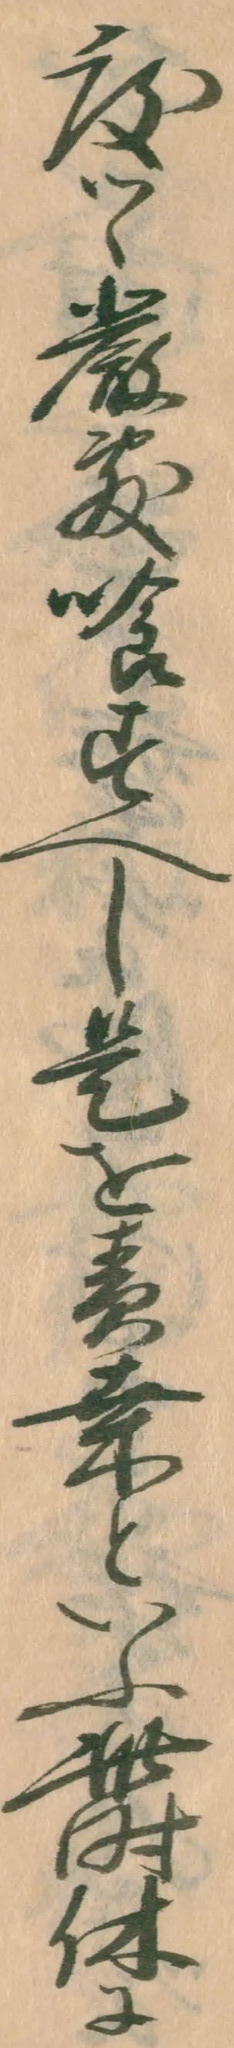度つゝ厳敷喰すへし是を責桑といふ此時休に
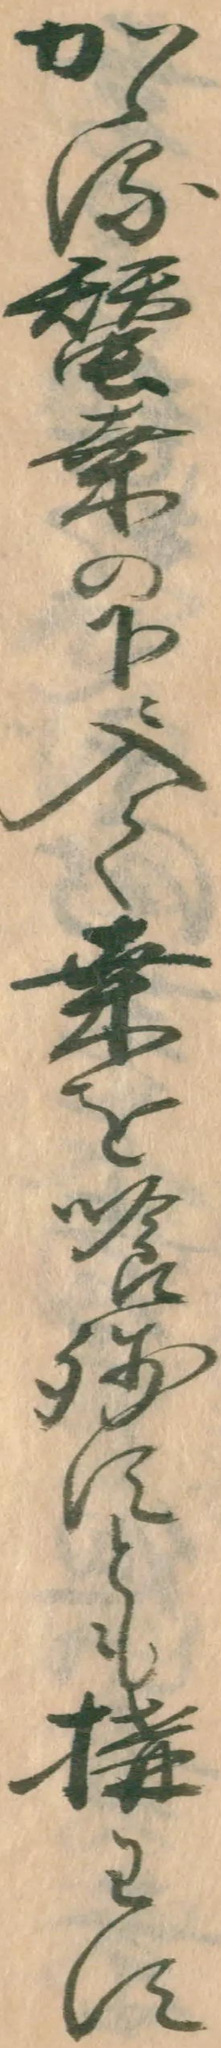かゝる蚕桑の下に入て桑を喰残すとも構わす
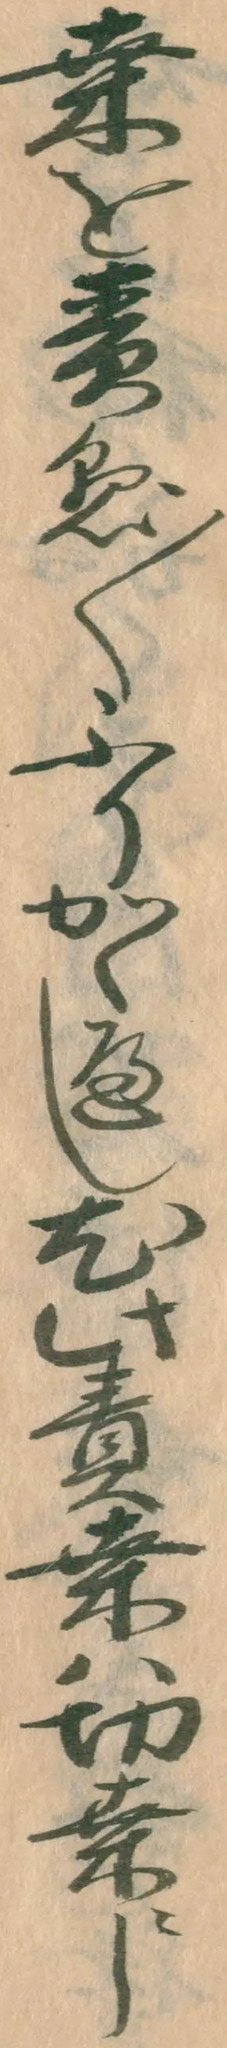桑を責懸〳〵ふりかくへし尤此責桑は切桑にし
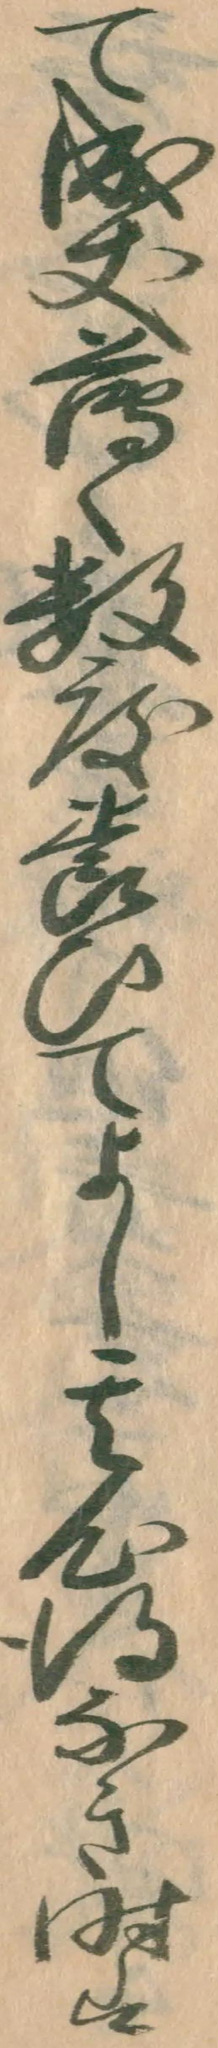て成丈薄く数度養ひてよし其心得なき時は

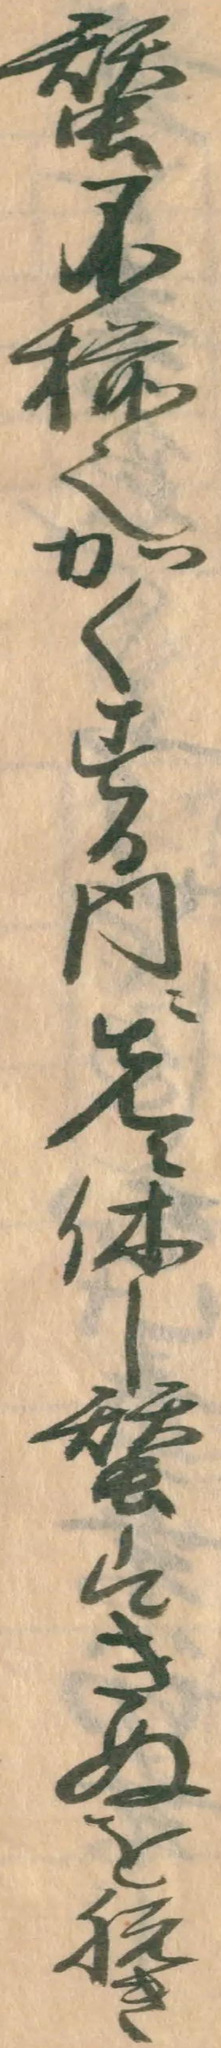蚕不揃也かくする内に先に休し蚕すきぬを祝き
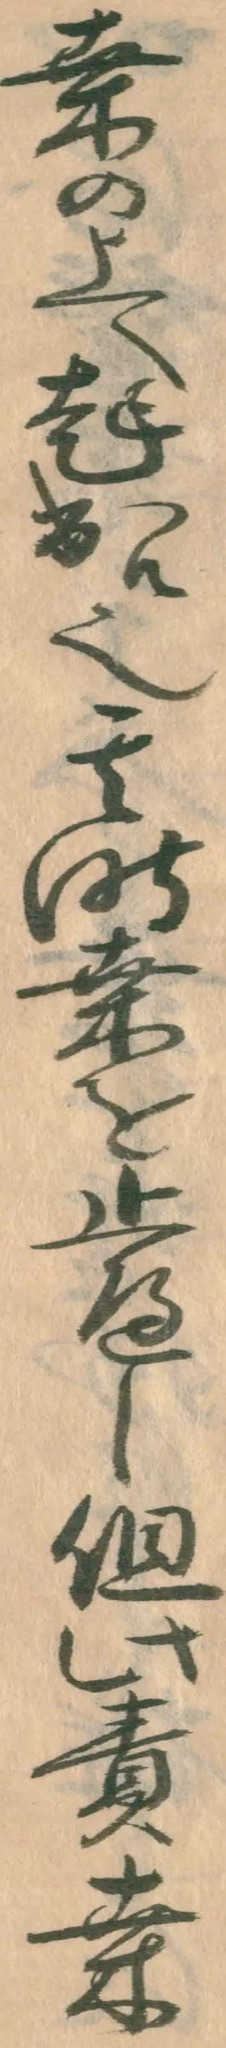桑の上へ起出候也其時葉を止へし但此責桑
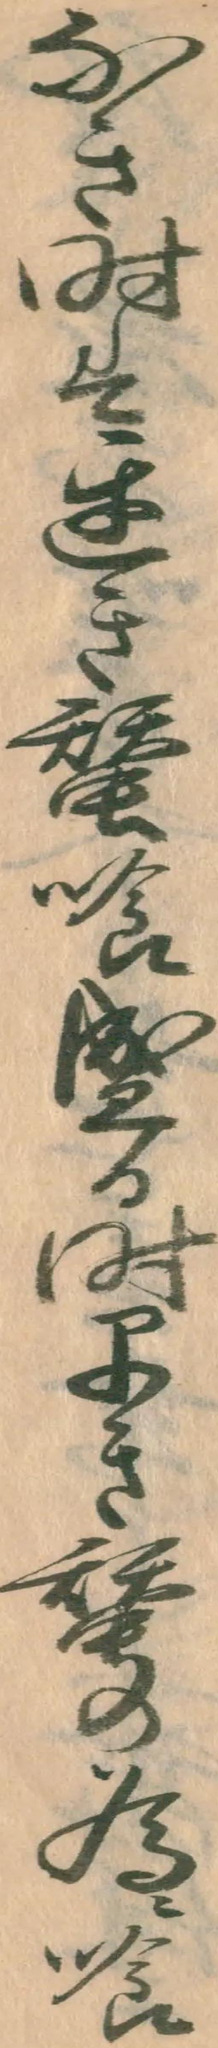なき時は遅き蚕喰盛る時早き蚕の為に喰
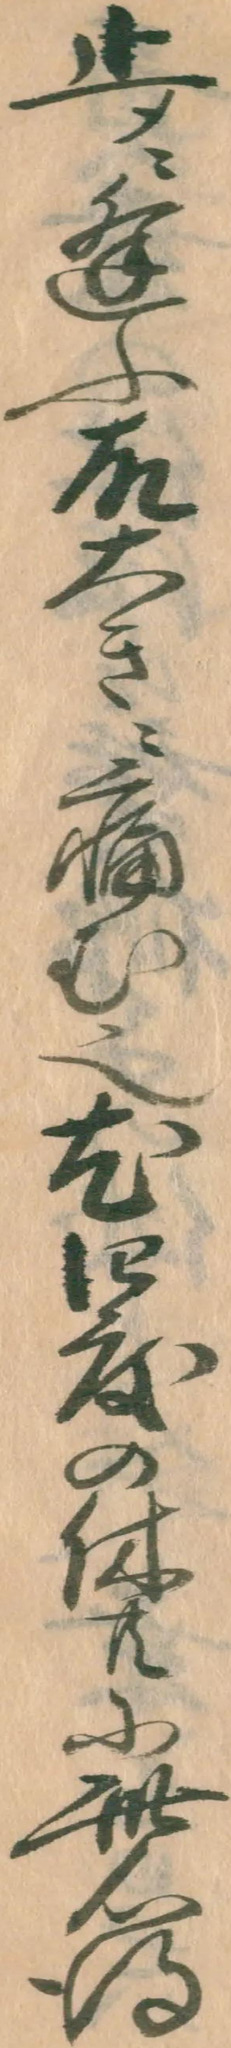止めに逢ふ故大きに痛む也尤四度の休共に此心得
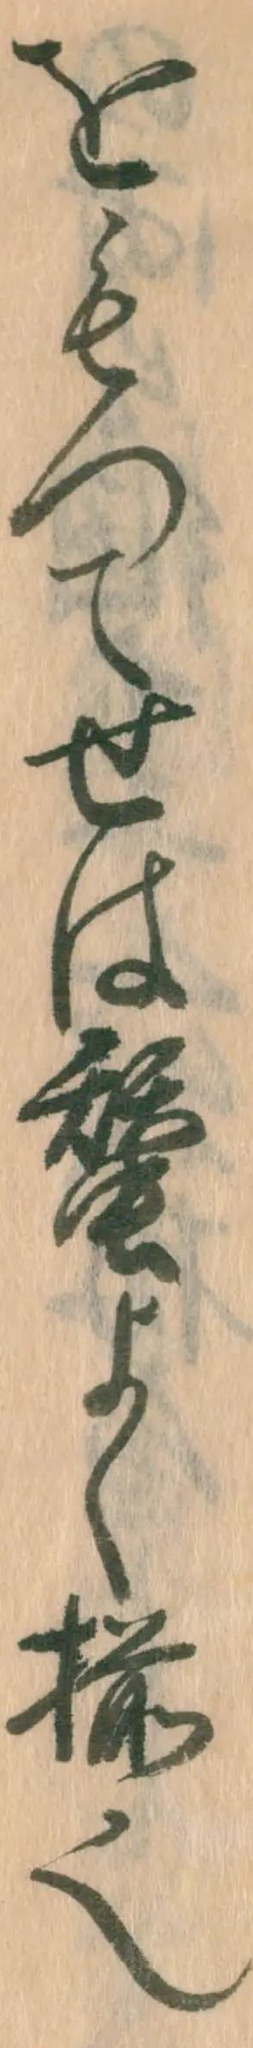をもつてせは蚕よく揃也
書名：養蚕録
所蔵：国立国会図書館 National Diet Library, JAPAN
